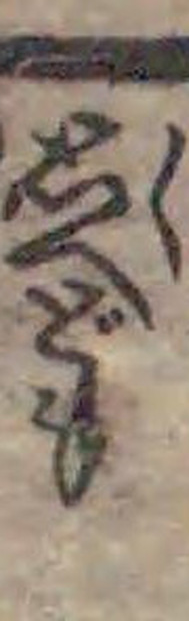思へども
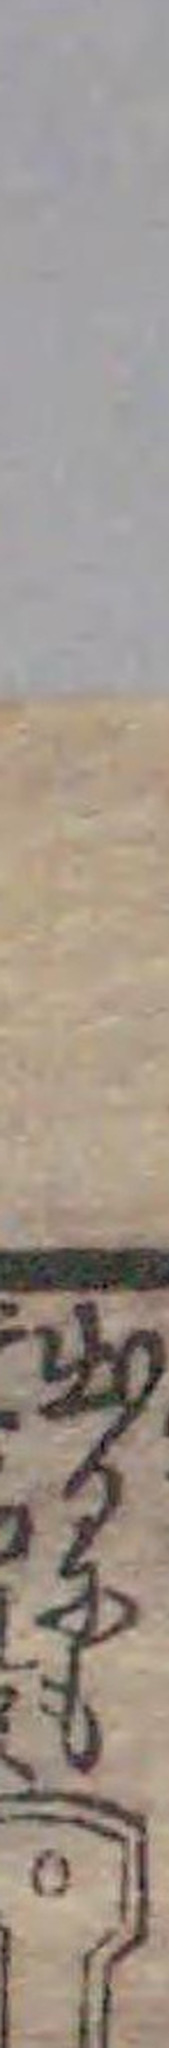出るにも
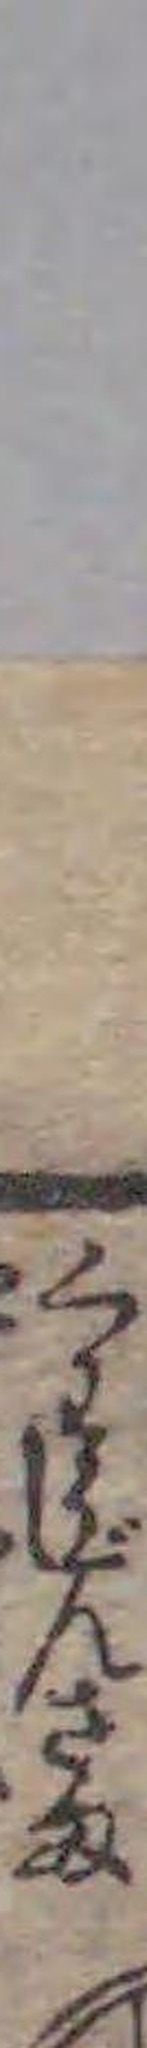くわうじんさま
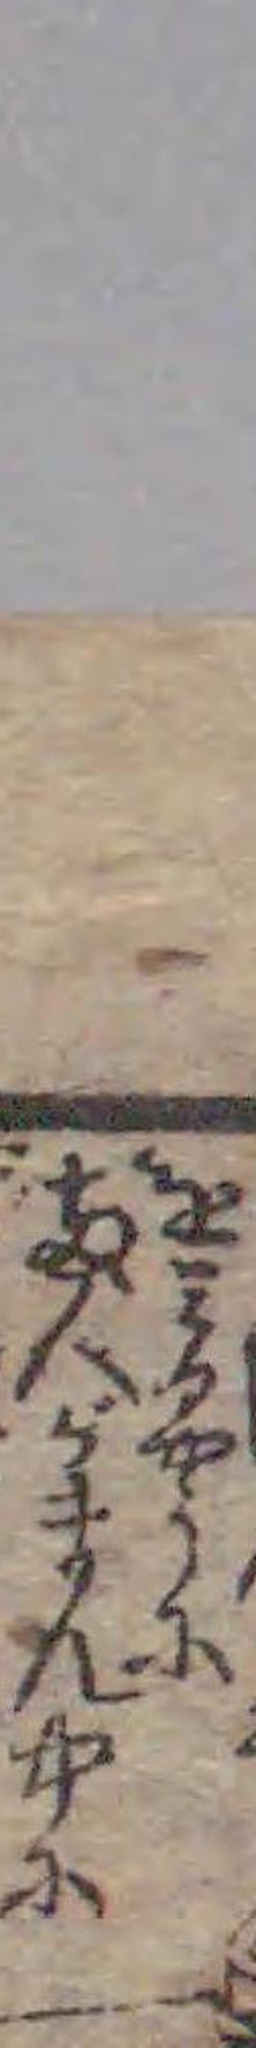両人がまん中に
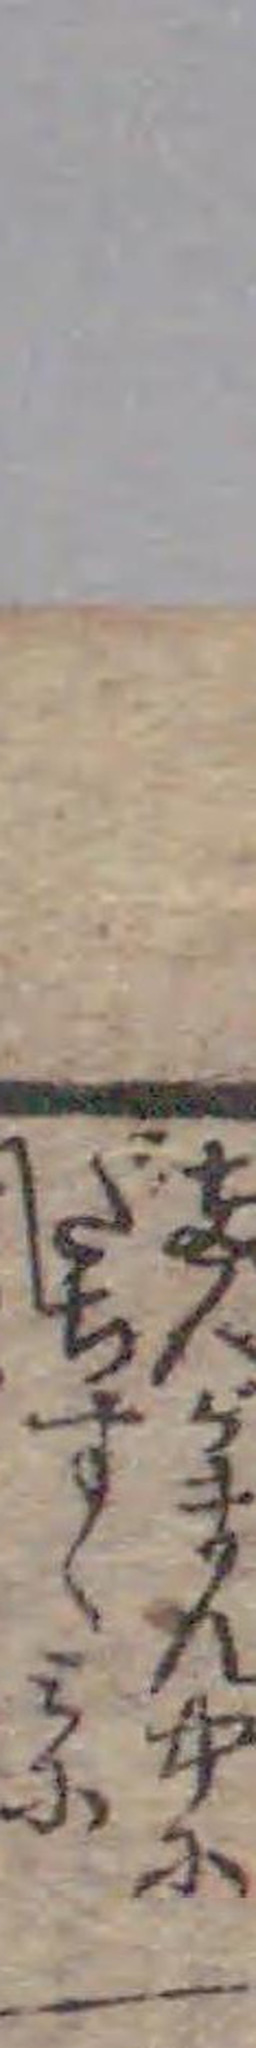たちすくみに
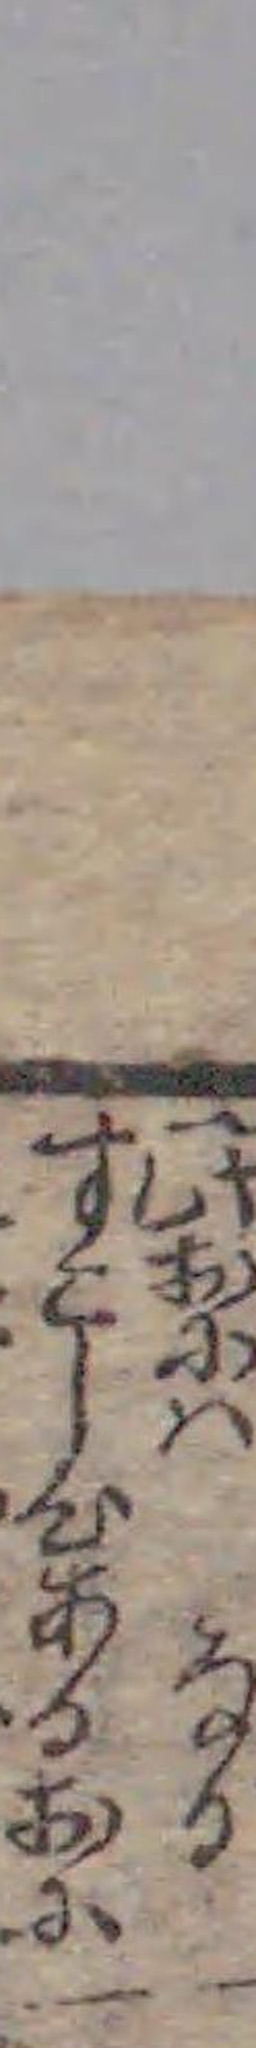すこし心あるおに
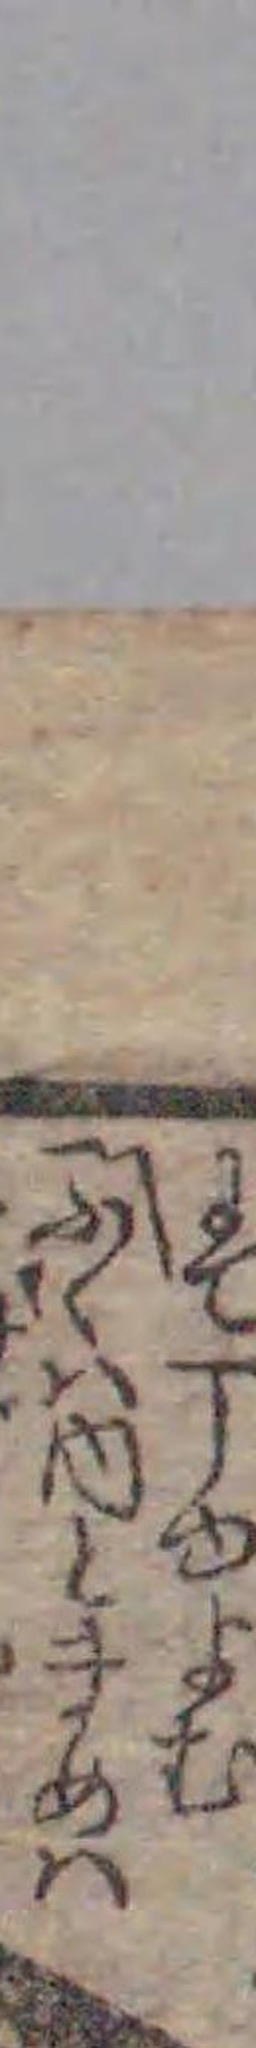〽ふくは内とまめは

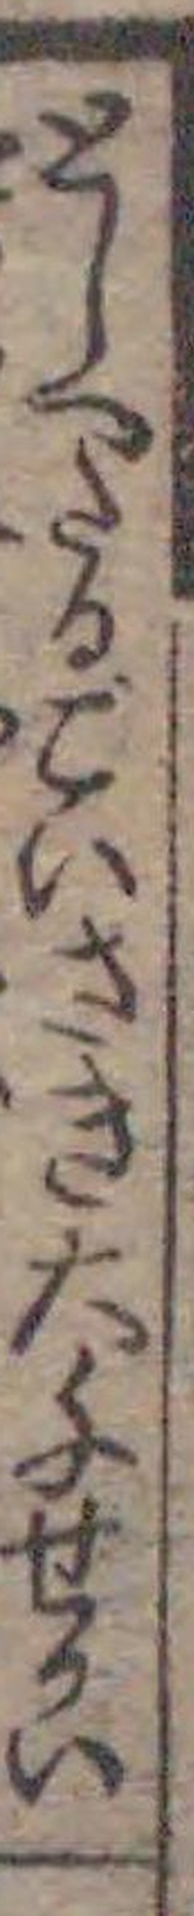としへたるごいさき大千せかい
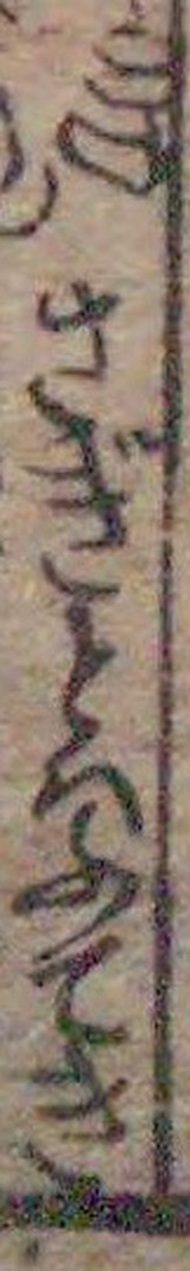さぎとはふてき
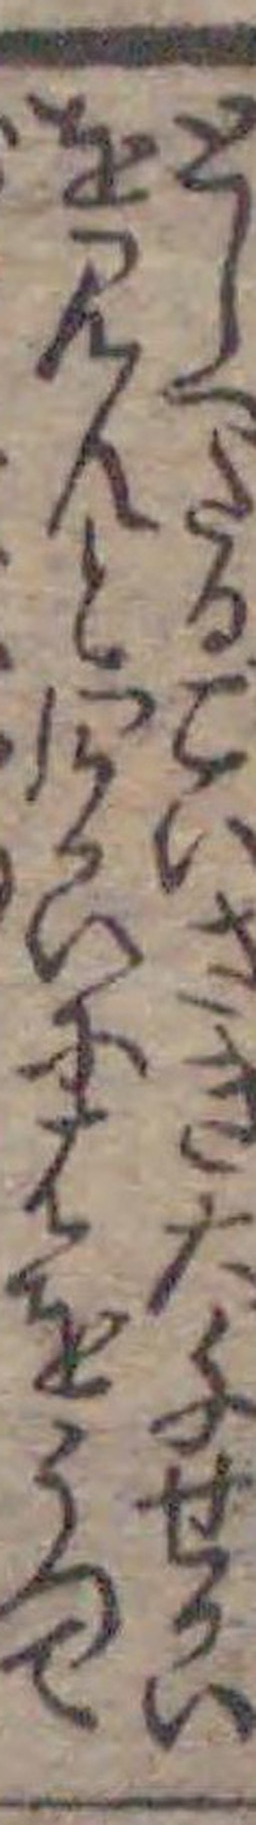をみんと四かいにはをうつて
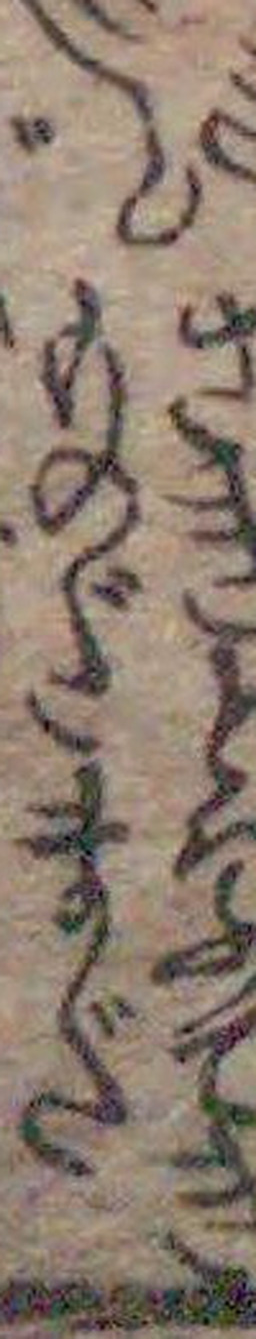ものだまだ
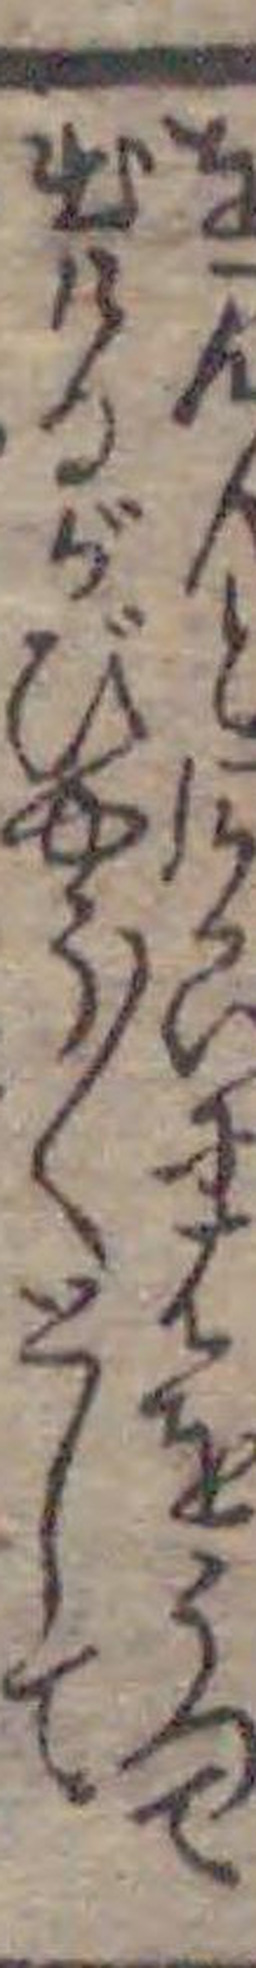出けるがびゆう〳〵として
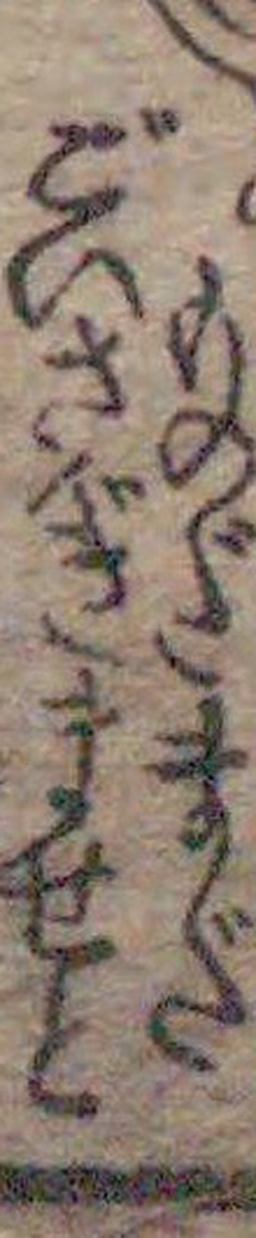ごいさぎませと
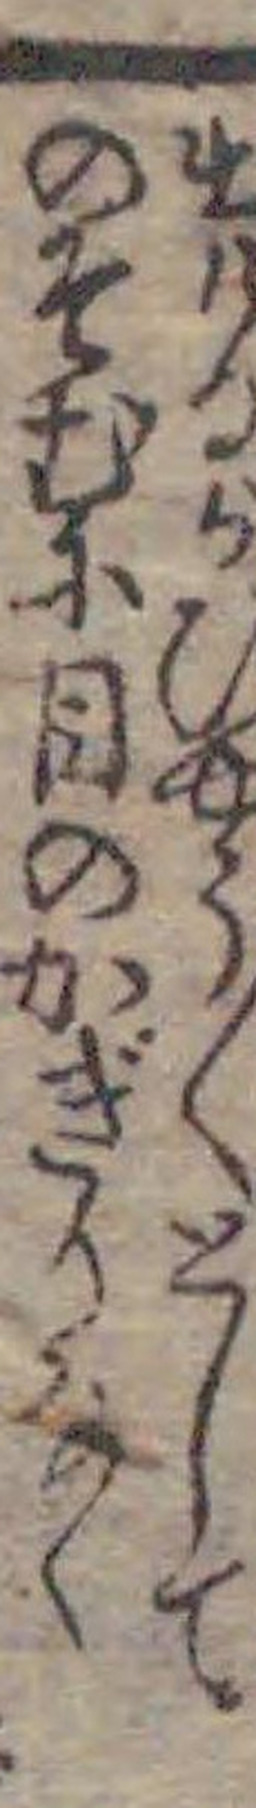のそむに目のかぎりなく
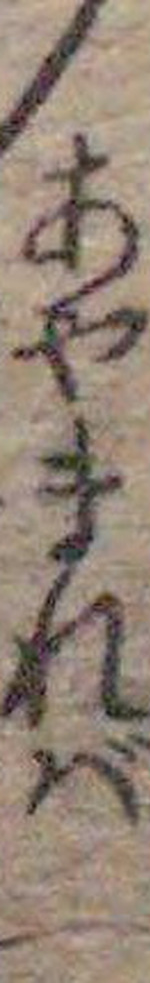あやまれば
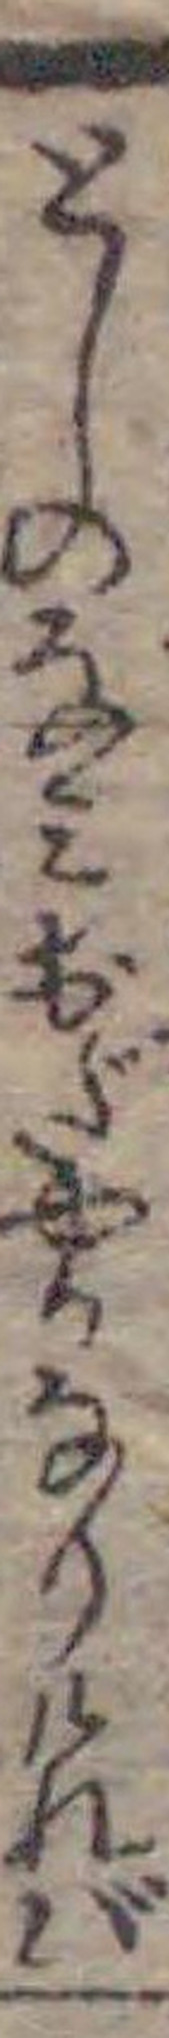としのなみおだやかなりければ
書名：怪物つれつれ草 : 2巻
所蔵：国立国会図書館 National Diet Library, JAPAN
